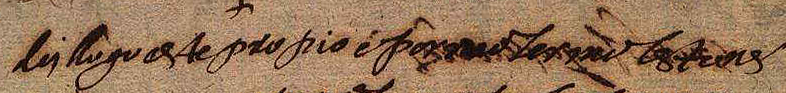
dei llogo este propio e por me ser molesto nes
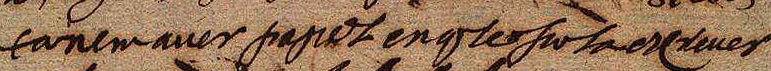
ta nem auer papel en q̄ se o posa esCreuer
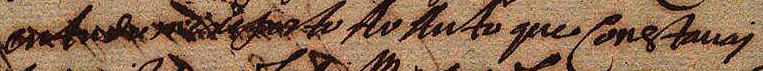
en tudo me reporto Ao Auto que Con esta uaj
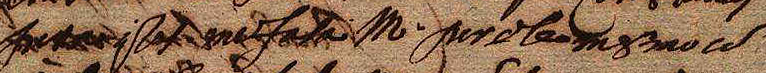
pera q̄ Vs me fasa M. por ele mesmo cō
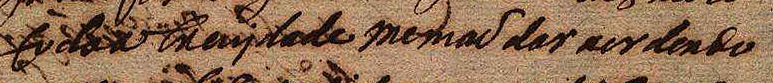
toda a breujdade me maõdar a orden do
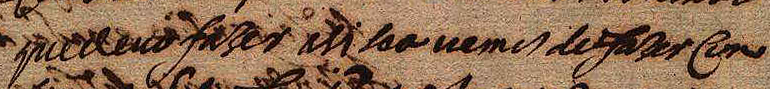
que deuo fazer asi se auemos de fazer Con
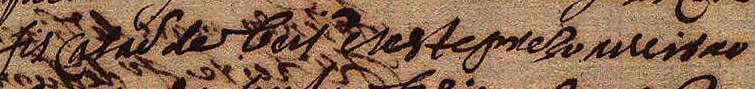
fiscasaõ de beis e se este prezo ao uir ao
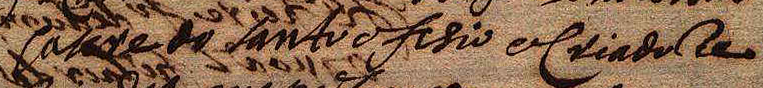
Casere do santo ofisio e Criado he
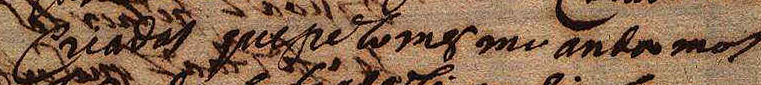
Criadas que pelo mesmo andamos
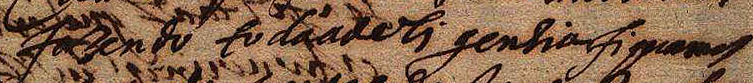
fazendo toda a deligensia fiquamos
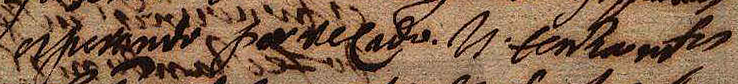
esperando por reCado. Vs. tenha mtos
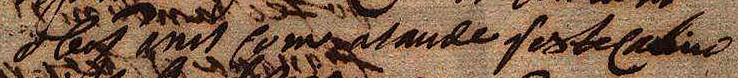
e bos̄ anos Com a saude q̄ este Catiuo
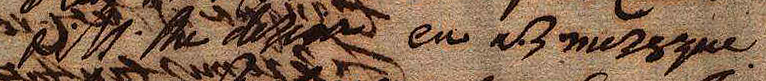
de .Vs. lhe dezeia eu a 3 mezes que
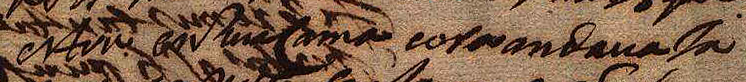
estiue en hua Cama e ora andaua ja
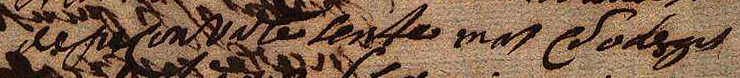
de pe Convalesente mas Cō o desgos
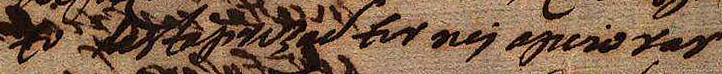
to desta prizaõ tornej a peiorar
